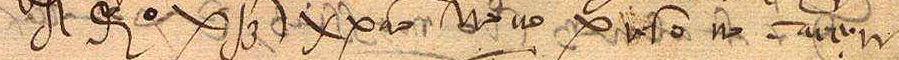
A djo pjz̄ xpaõ nouo preso no carcere
